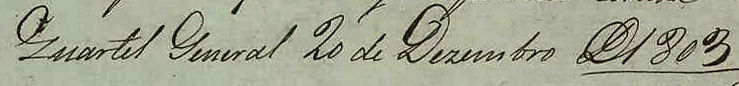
Quartel General 20 de Dezembro d̄ 1803
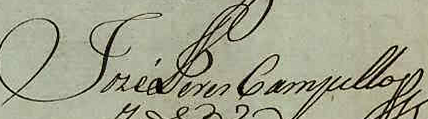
Jozé Peres Campello
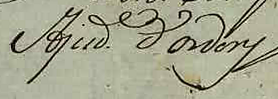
Ajud.e d̄ ordens
